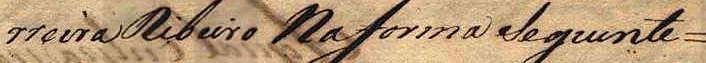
rreira Ribeiro Na forma Seguinte
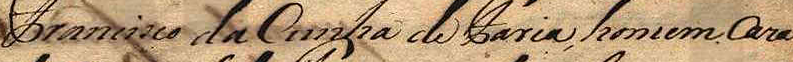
Francisco da Cunha de Faria, homem caza
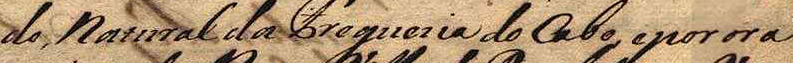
do Natural da Freguezia do Cabo, e por ora
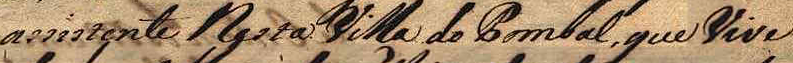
assistente Nesta Villa do Pombal, que Vive
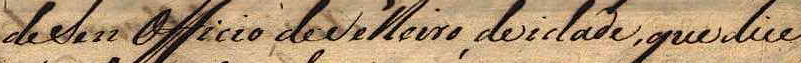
de Seu officio de selleiro, de idade, que dice
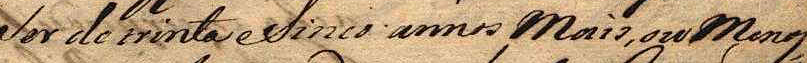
ser de trinta e Sinco annos Mais, ou Menos,
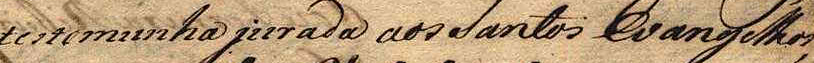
testemunha jurada aos Santos Evangelhos,
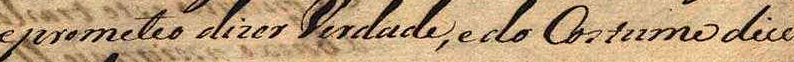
e prometeo dizer Verdade, e do Costume dice
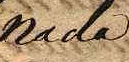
Nada
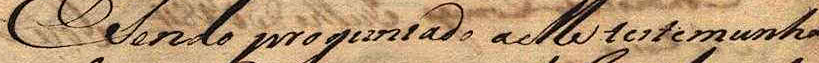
E Sendo proguntado a elle testemunha
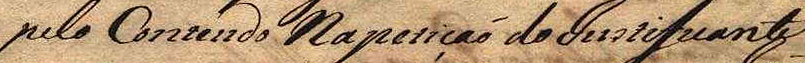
pelo Conteudo Na petição do Iustificante
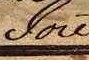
Iozé
